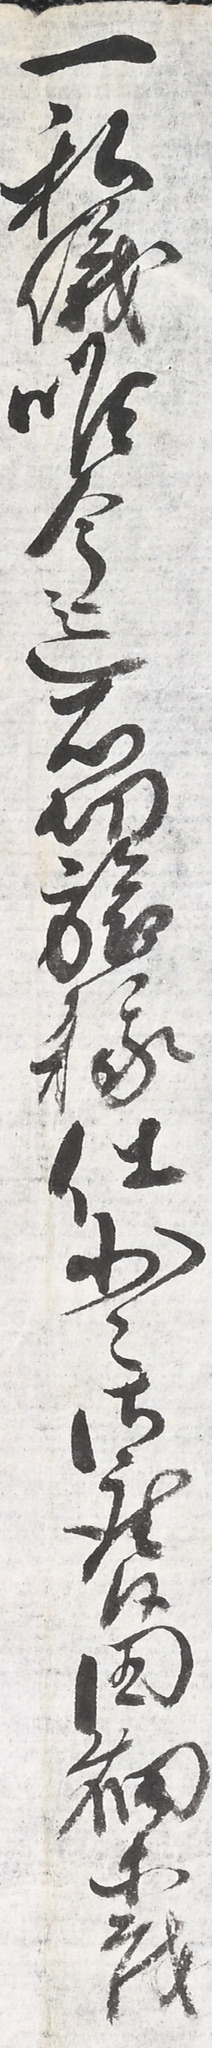一私儀唯今迄石切旅稼仕少々御座候田畑等茂
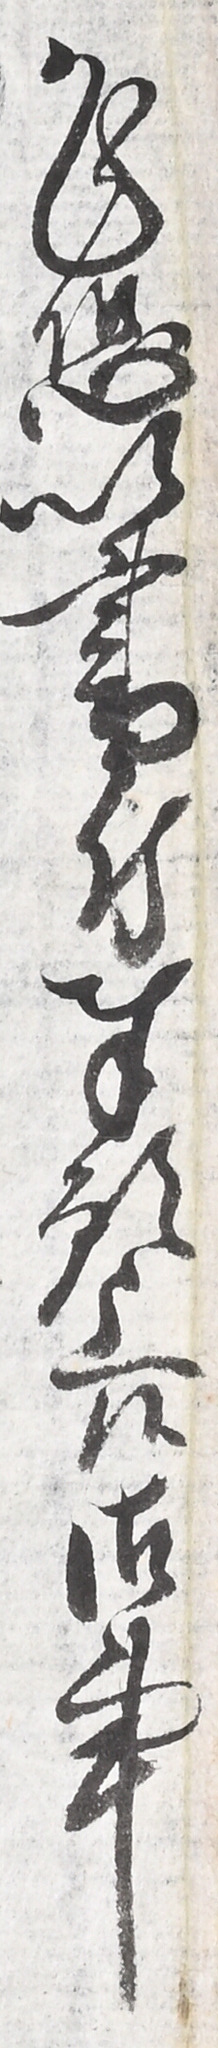乍恐以書付奉願上候御事
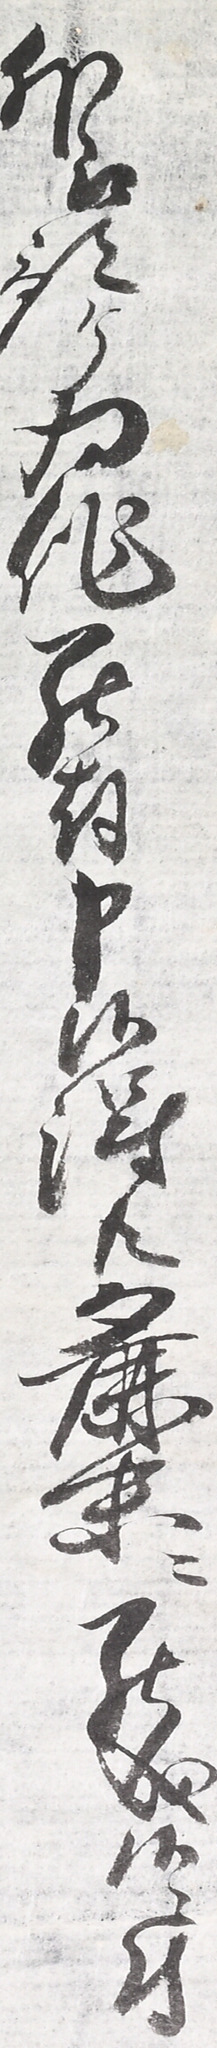外江預ヶ為作罷有申候得共粗末ニ罷成候ニ付
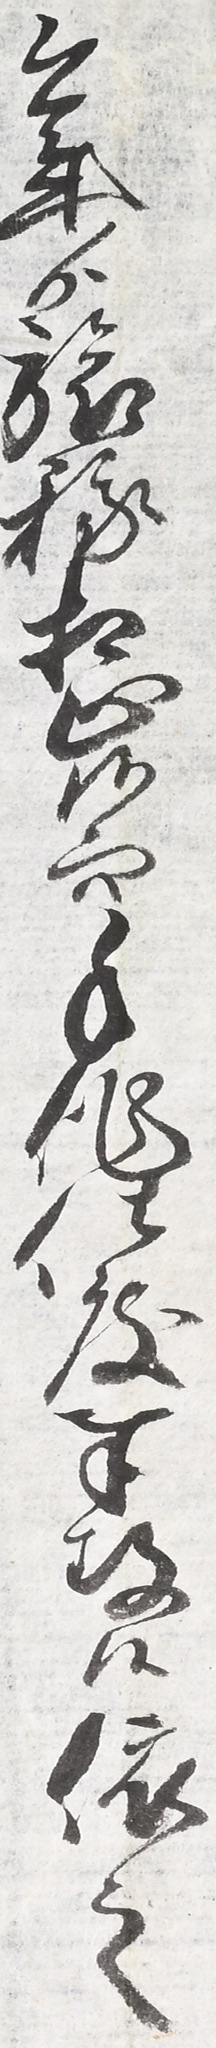今年ゟ旅稼相止候而手作仕度奉存候依之
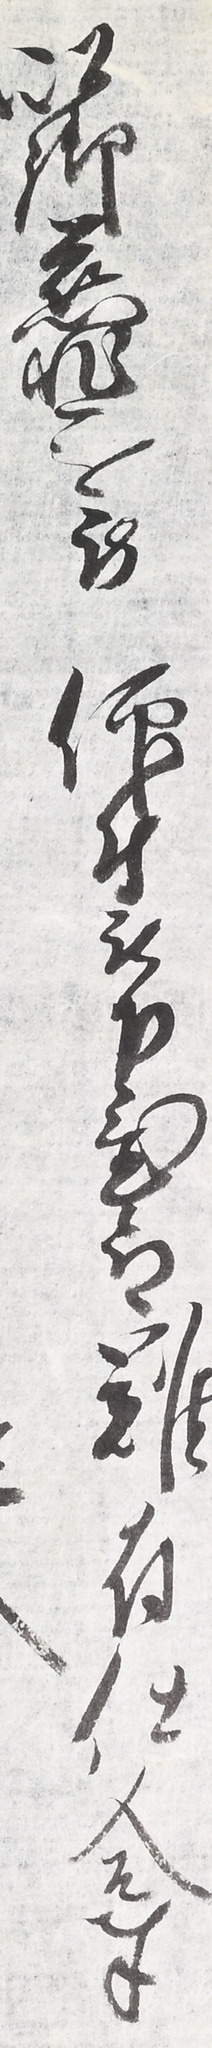以御慈悲を被仰付被下置候ハヽ難有仕合奉
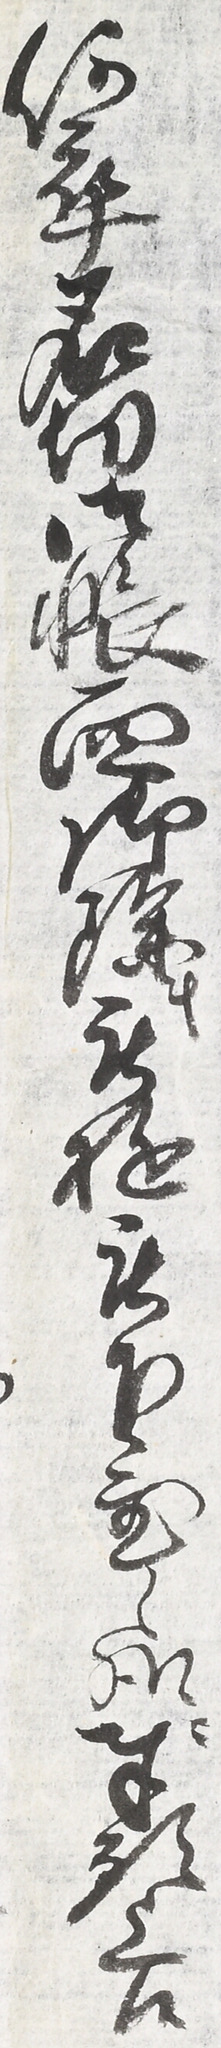何卒石切御帳面御除キ被遊被下置候処ニ奉願上候
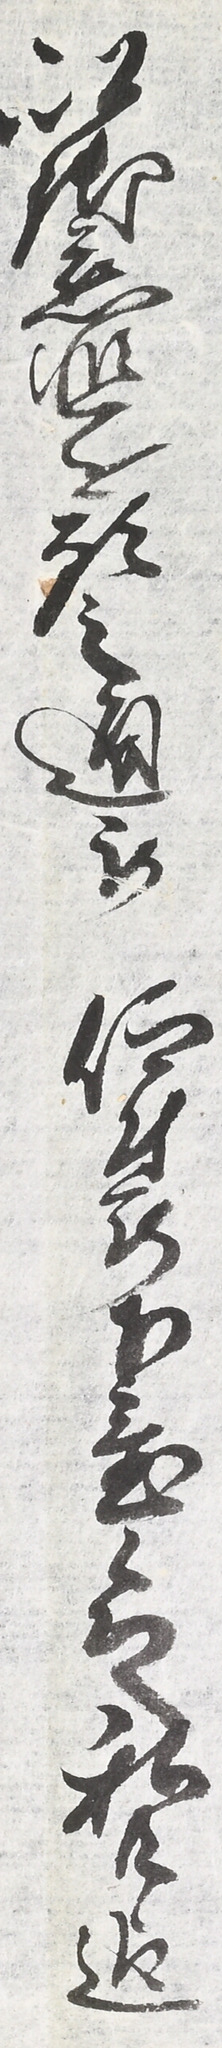以御慈悲を願之通被仰付被下置候ハヽ私共迄
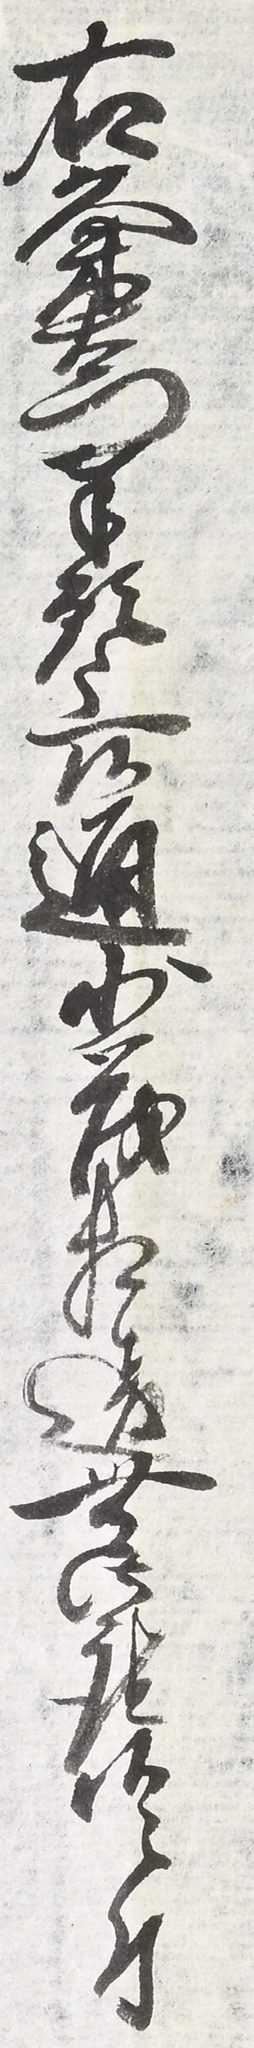右粂右衛門奉願上候通少茂相違無御座候ニ付
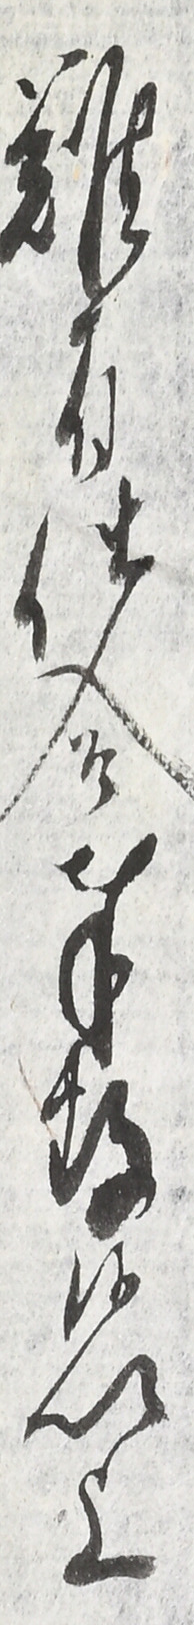難有仕合奉存候以上
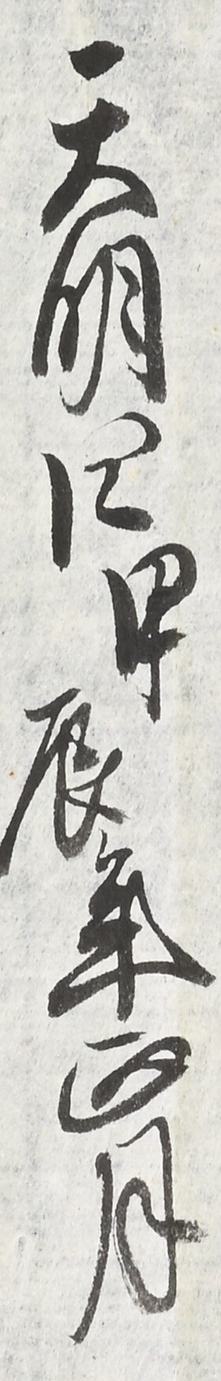天明四甲辰年正月
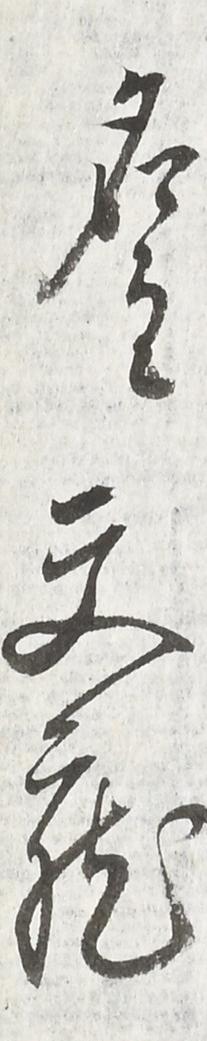名主文蔵
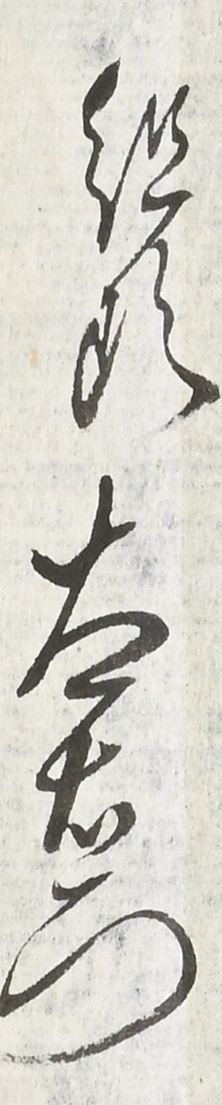組頭太右衛門
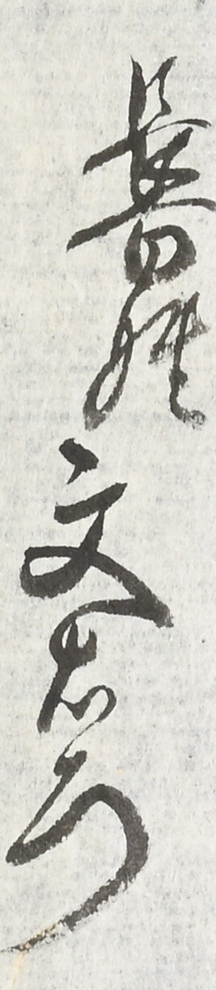長百姓文右衛門
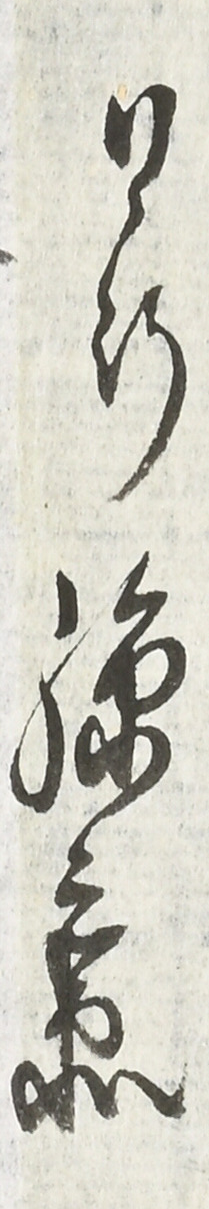同断孫兵衛
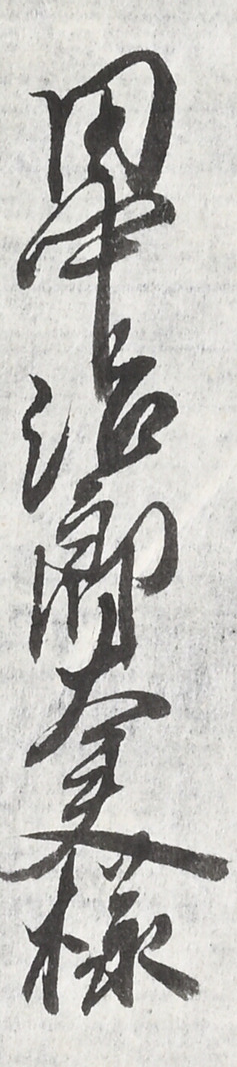田中治郎太夫様
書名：乍恐以書付奉願上候御事
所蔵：伊那市立高遠町図書館・合同会社AMANE
